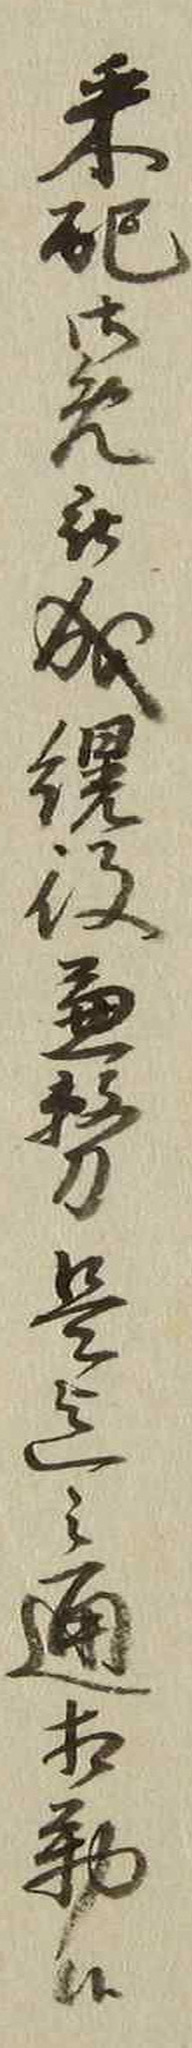采配御免被成縨役兼務是迄之通相勤候
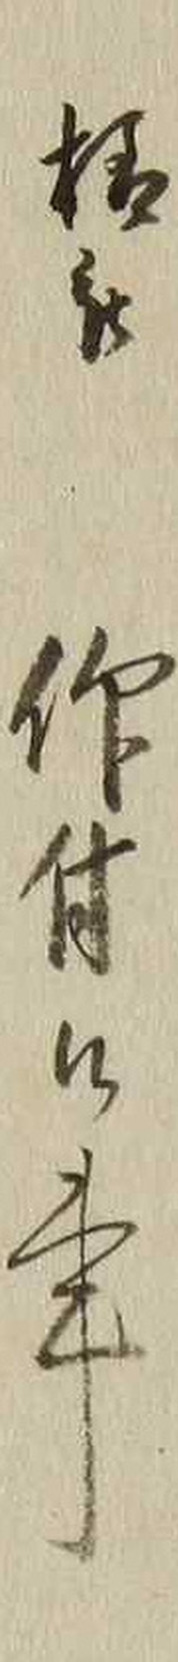被仰付候事
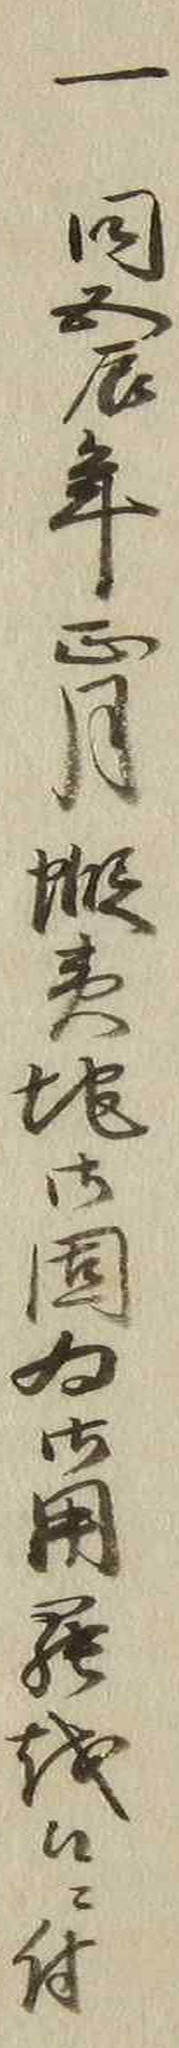一同五辰年正月蝦夷地御固為御用罷越候に付
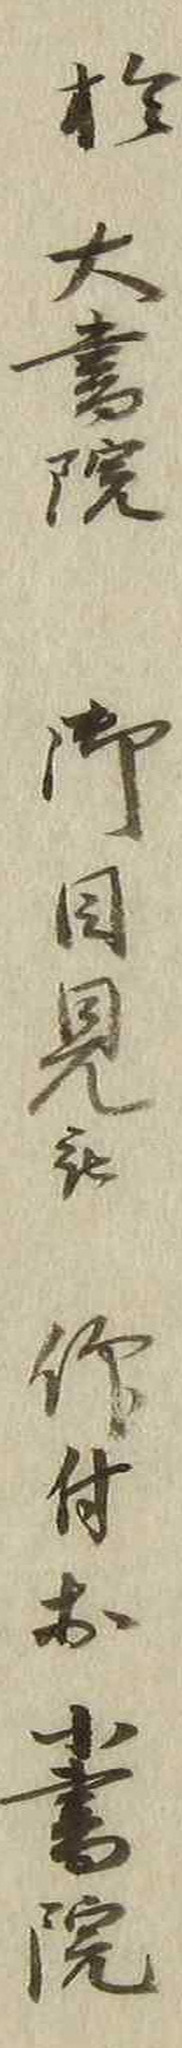於大書院御目見被仰付於書院
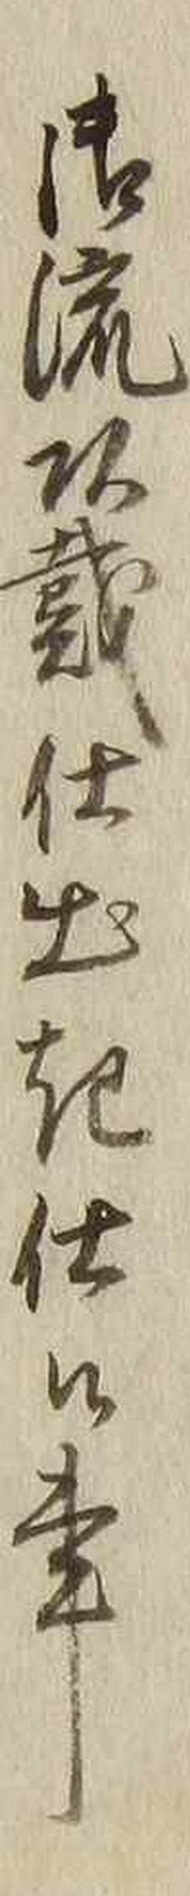御流頂戴仕出起仕候事
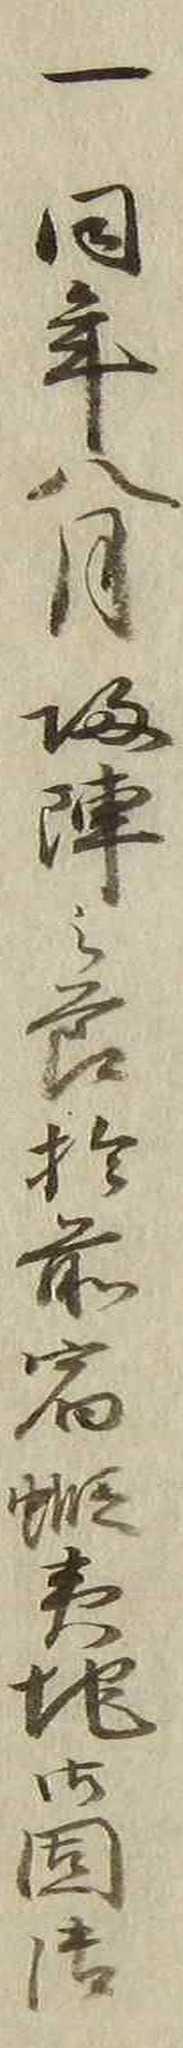一同年八月帰陣之節於前宿蝦夷地御固御
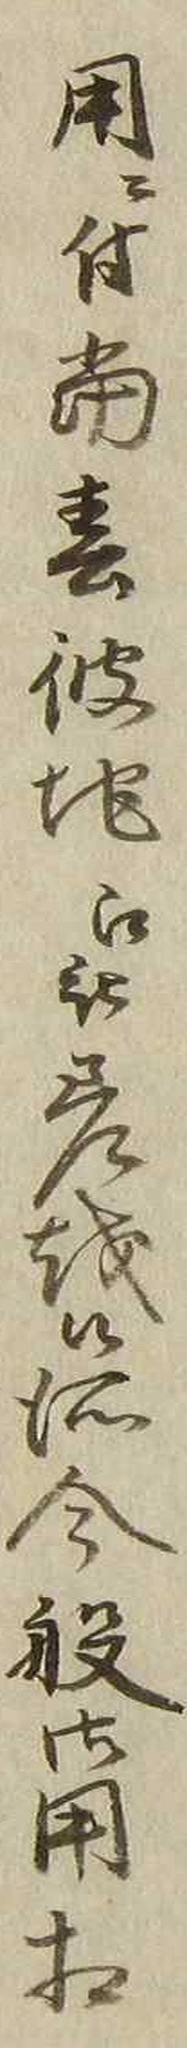用に付当春彼地江被差越候所今般御用相
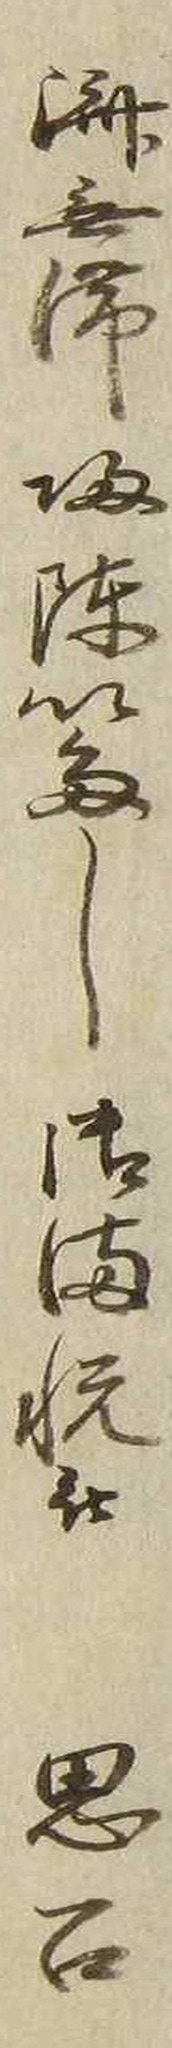済無滞帰陣いたし御満悦被思召
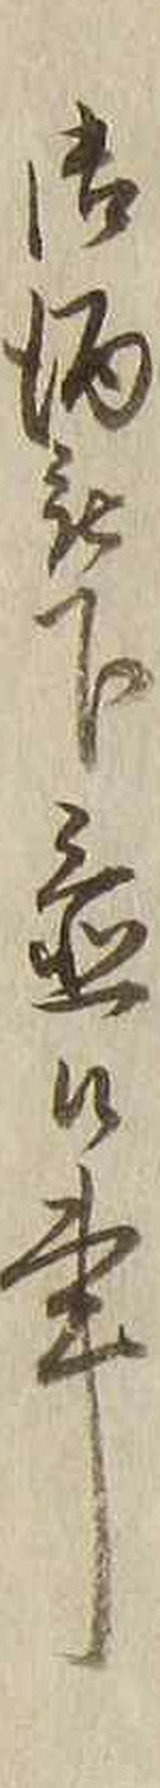御酒被下置候事
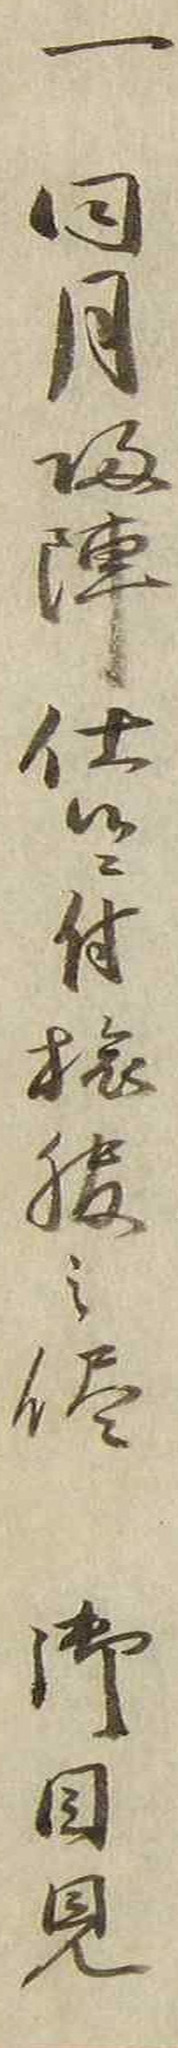一同月帰陣仕候に付旅服之侭御目見

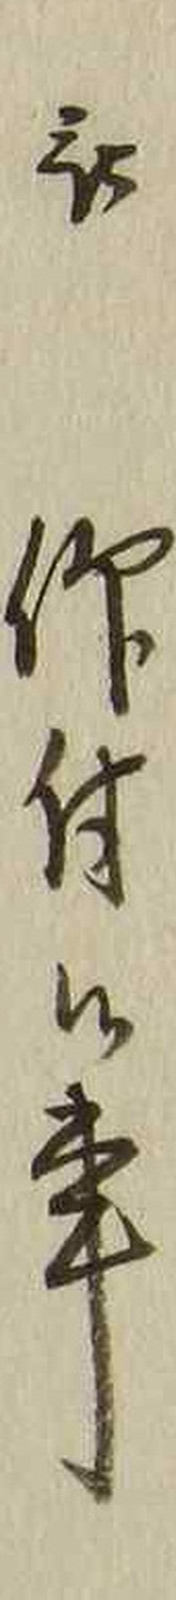被仰付候事
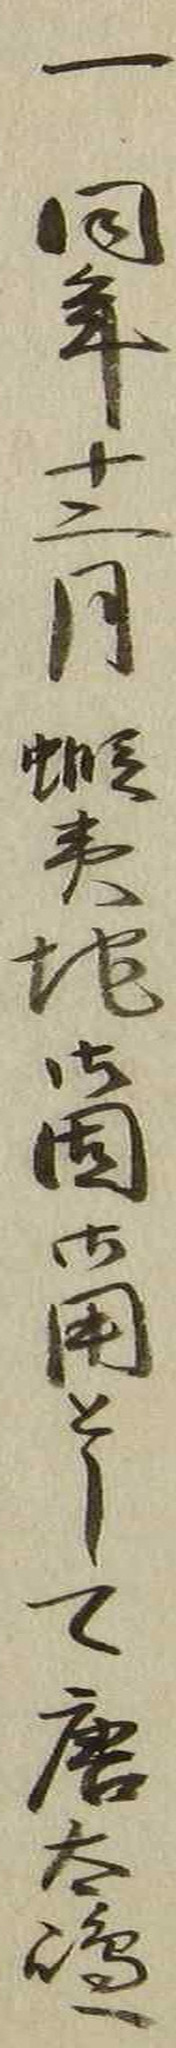一同年十二月暇夷地御固御用として唐太嶋へ
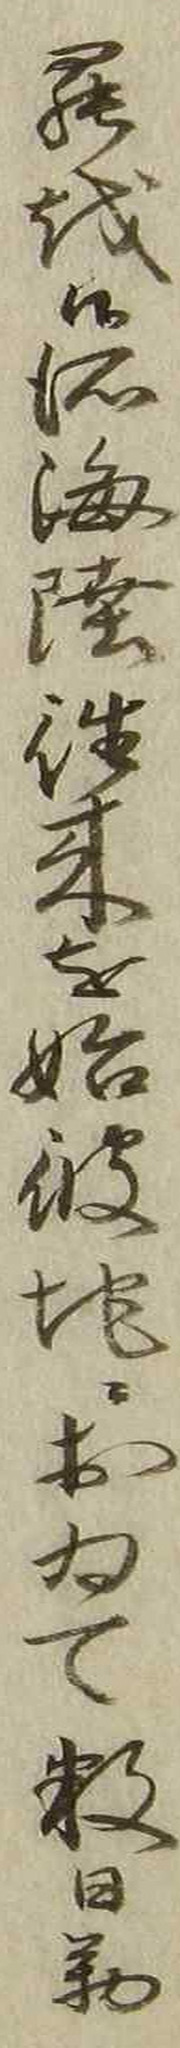罷越候所海陸往来を始彼地におゐて数日勤
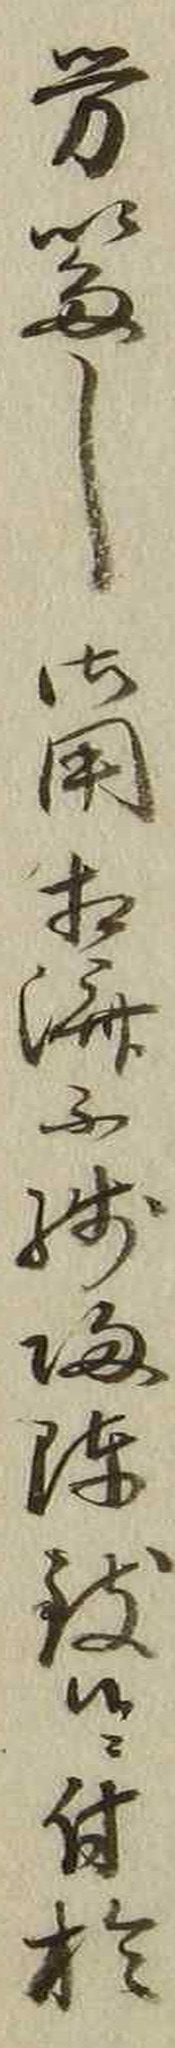労いたし御用相済不残帰陣致候に付於
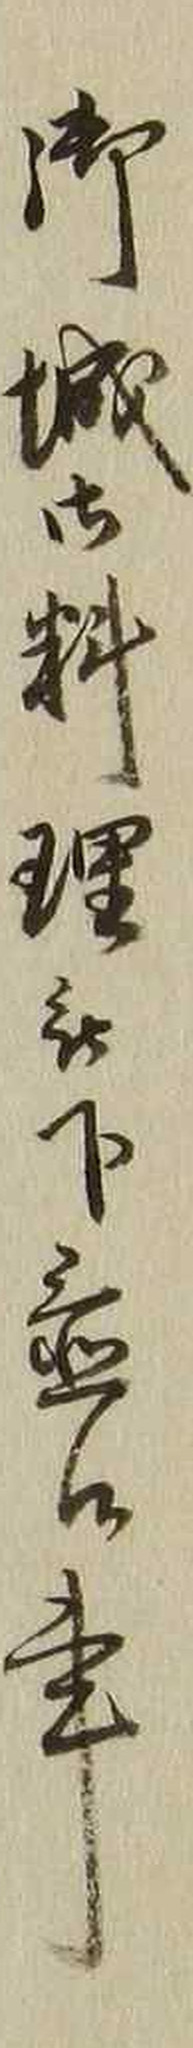御城御料理被下置候事
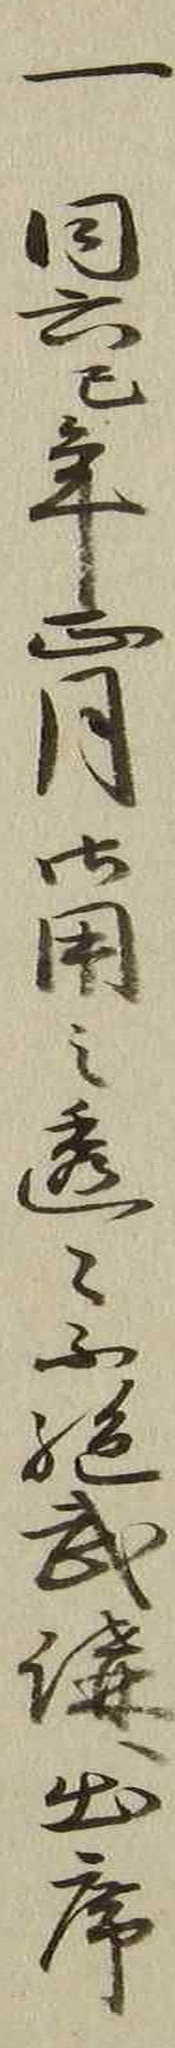一同六巳年正月御用之透々不絶武講へ出席
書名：諸士系譜　巻之133　た之部9
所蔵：会津若松市立会津図書館
